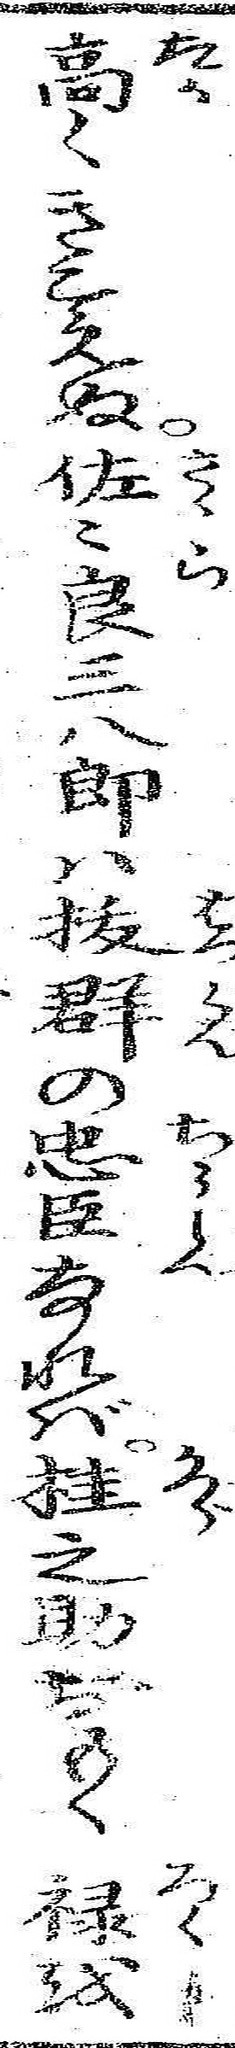高くきこえぬ。佐々良三八郎は抜群の忠臣なれば。桂之助ぢもく禄を
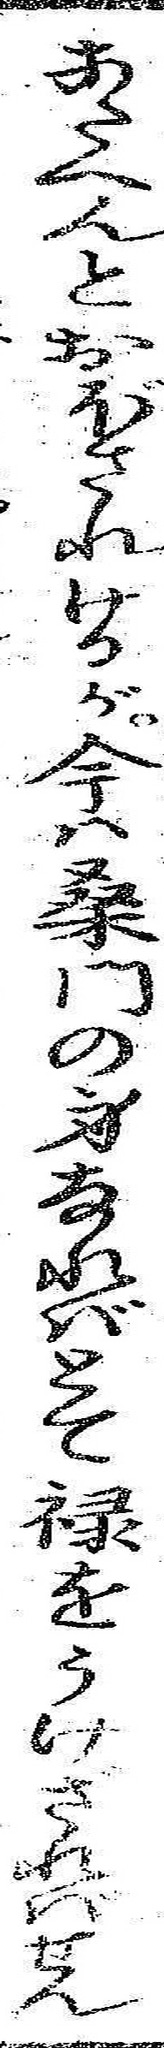あたへんとおぼされけるが。今は桑門の身なればとて禄をうけざればせん
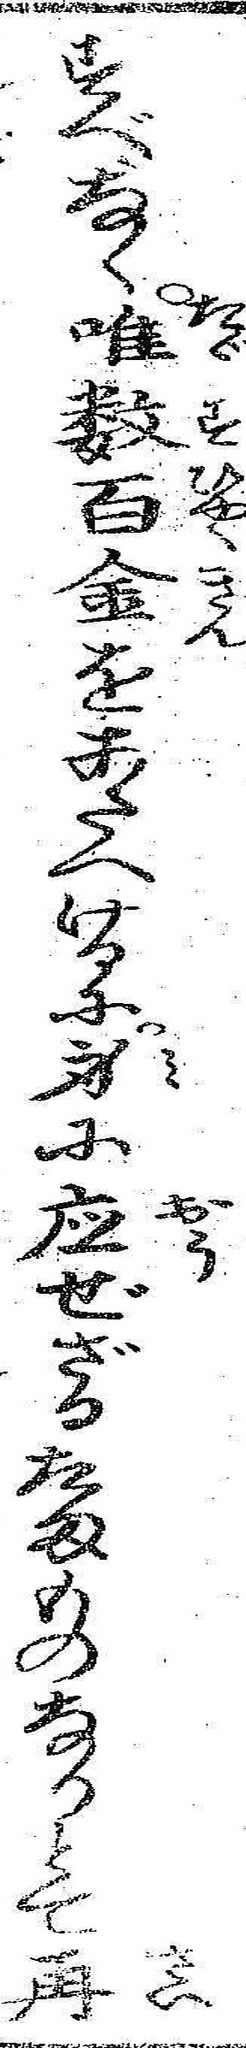すべなく。唯数百金をあたへけるに。身に応ぜざるたまものなりとて再
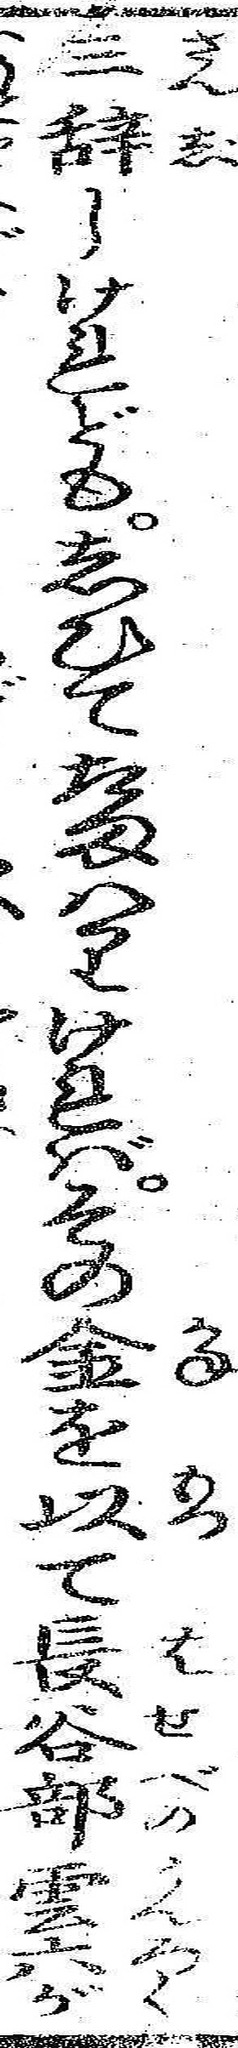三辞しけれども。しひてたまはりければ。その金を以て長谷部雲六が
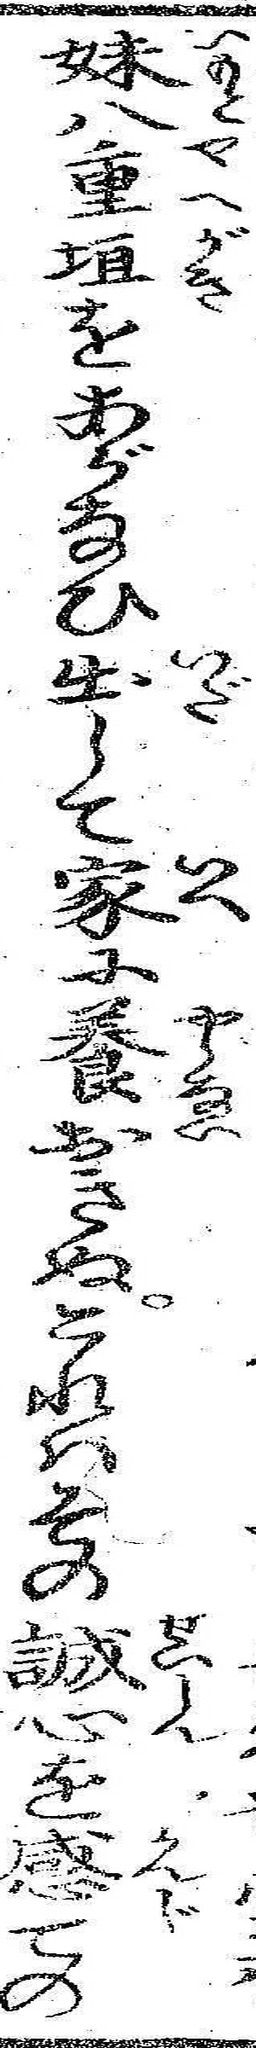妹八重垣をあがなひ出して家に養おきぬ。これはその誠心を感ての
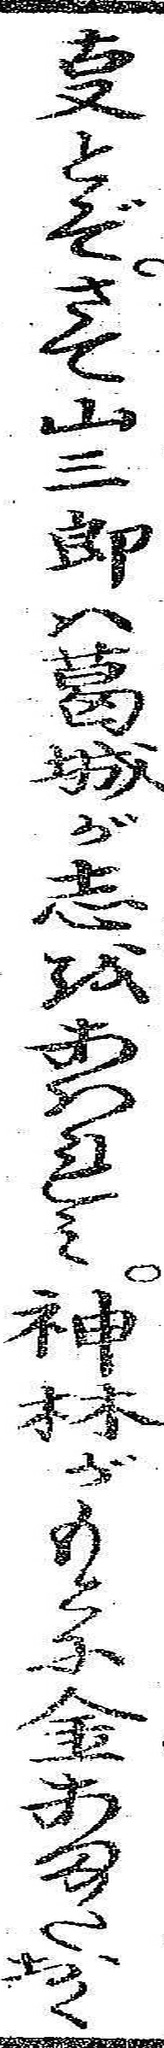事とぞ。さて山三郎は葛城が志をあはれみ。神林がもとに金あまたおく
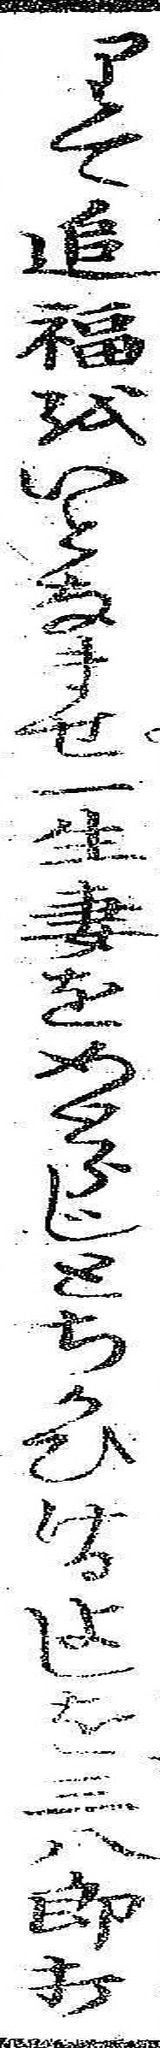りて追福をいとなませ。一生妻をめとらじとちかひけるよしを。三八郎打
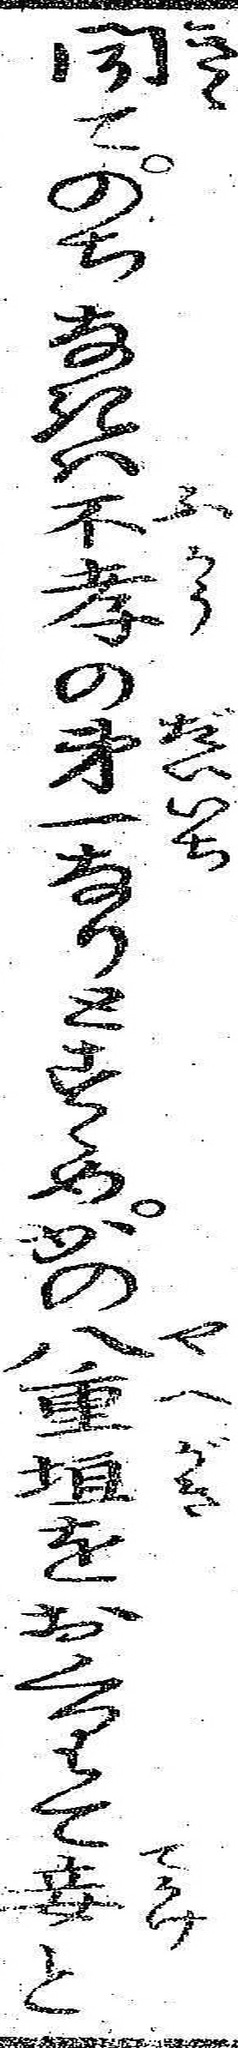聞て。のちなきは不孝の第一なりとすゝめ。かの八重垣をおくりて妾と
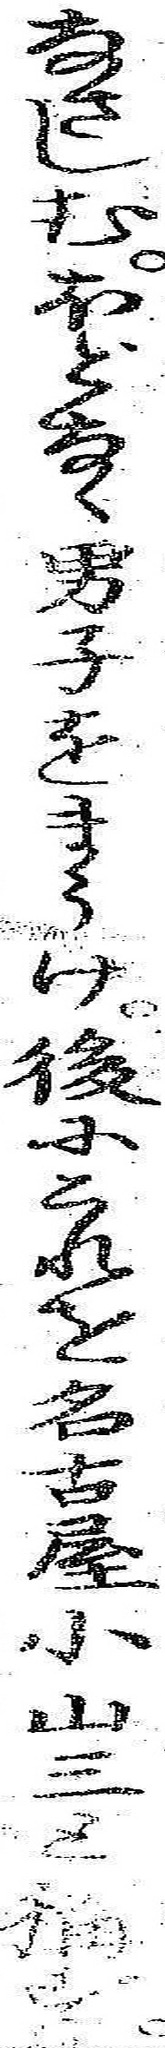なさしむ。ほどなく男子をまうけ。後にこれを名古屋小山三と称す。

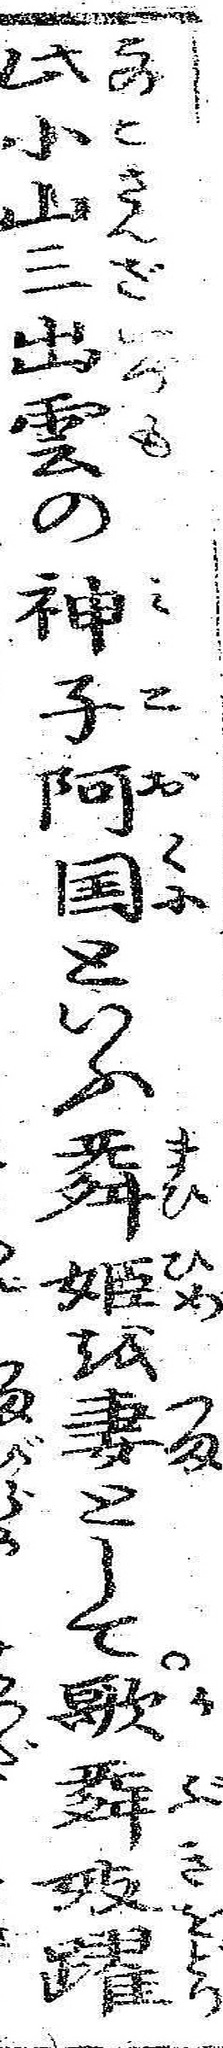此小山三出雲の神子阿国といふ舞姫を妻として。歌舞妓躍
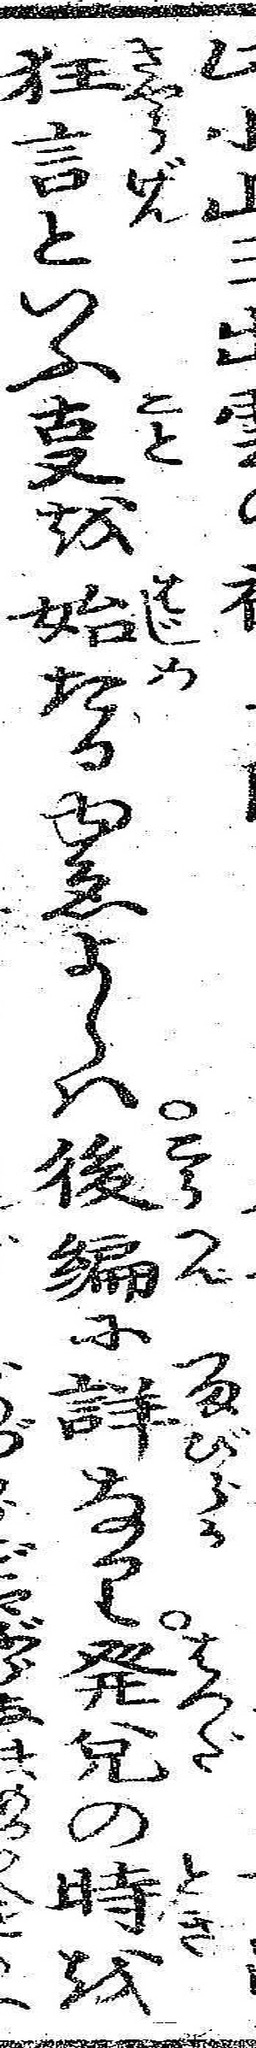狂言といふ事を始たるゆゑよしは。後編に詳なり。発兌の時を
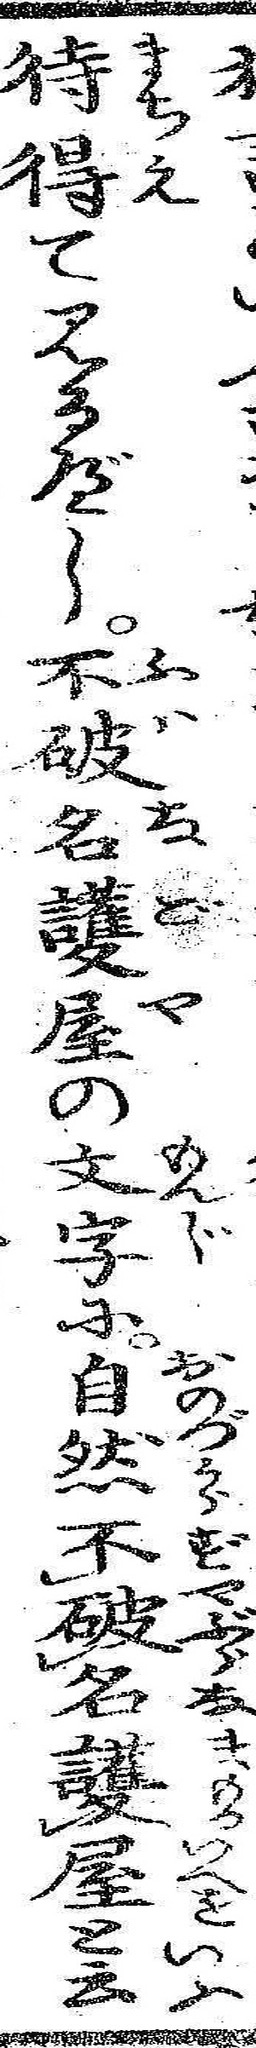待得て見るべし。不破名護屋の文字に。自然不破名護屋と云
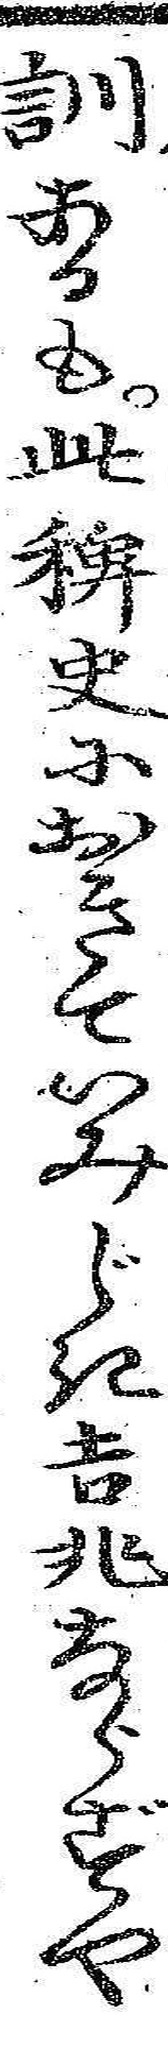訓あるも。此稗史におきていみじき吉兆ならずや
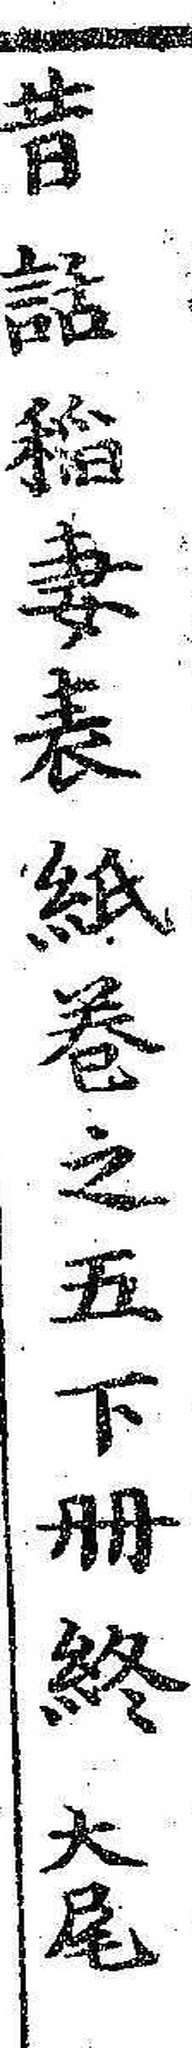昔話稲妻表紙巻之五下冊終大尾
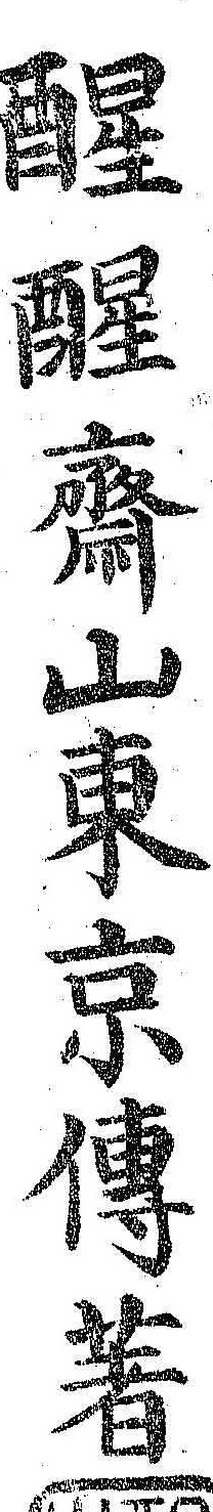醒醒斎山東京伝著
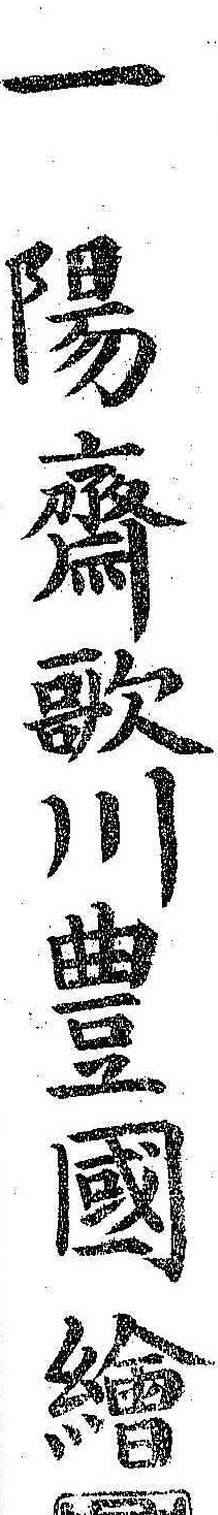一陽斎歌川豊国絵
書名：昔話稲妻表紙
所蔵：国文学研究資料館
